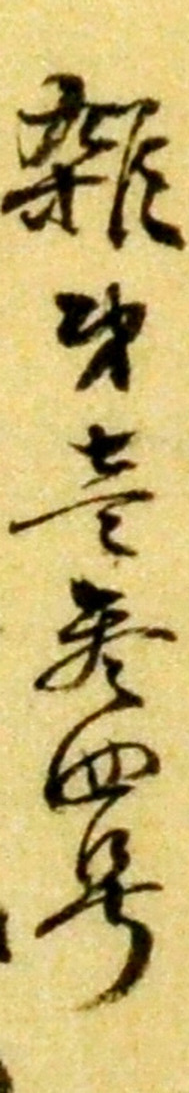雑第壱参四号
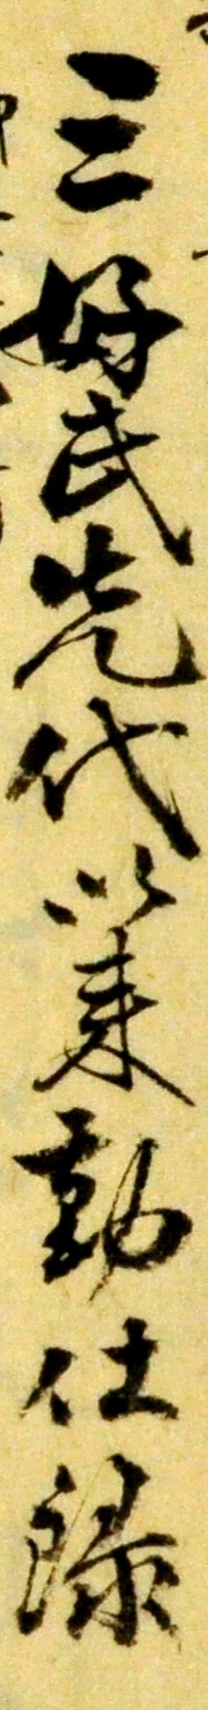三好氏先代以来勤仕録
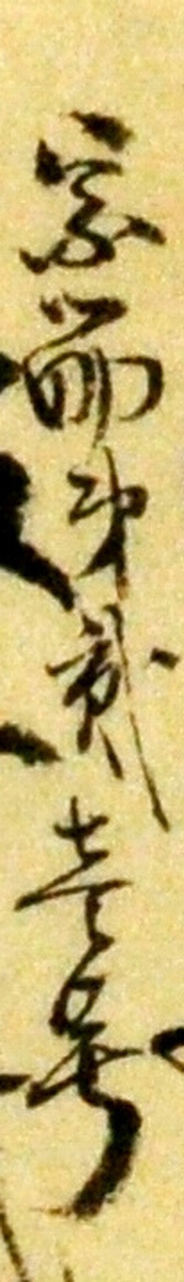家筋第弐壱号
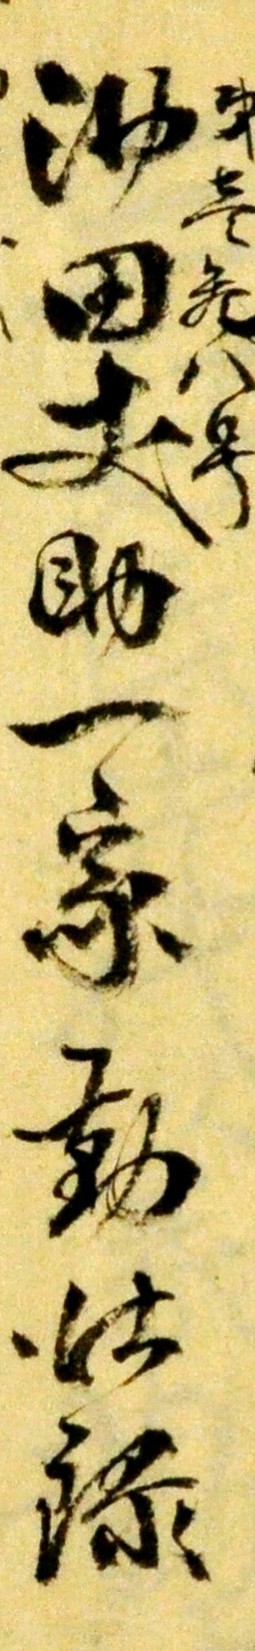池田丈助一家勤仕録
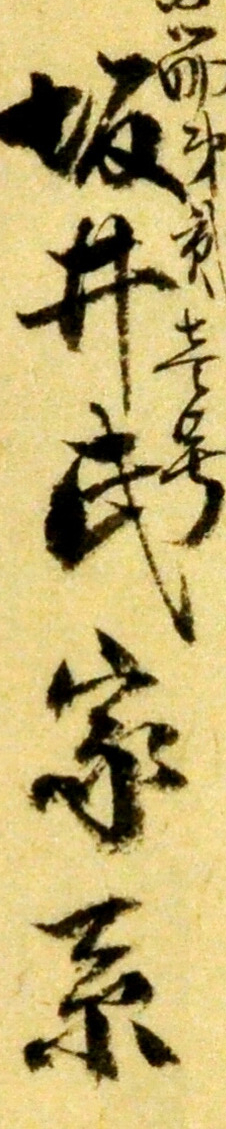坂井氏家系
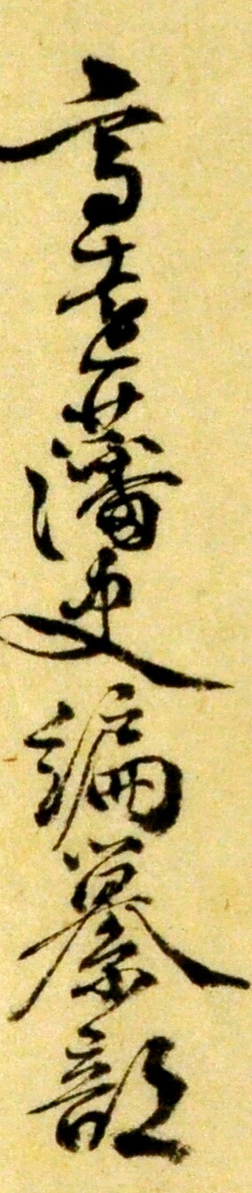高遠藩史編纂部

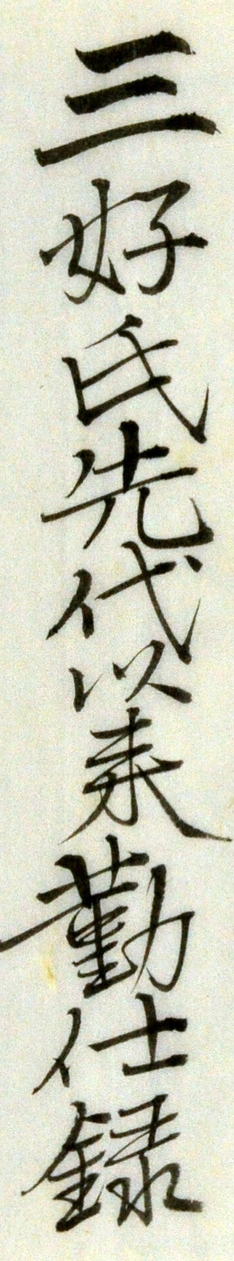三好氏先代以来勤仕録
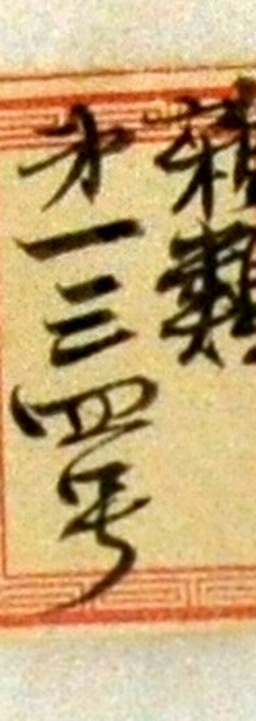第一三四号

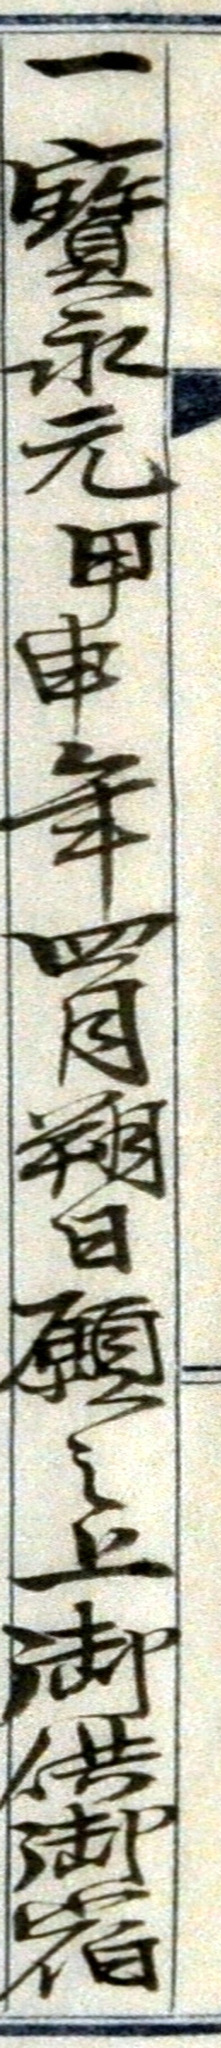一宝永元甲申年四月朔日願之上御供御宿
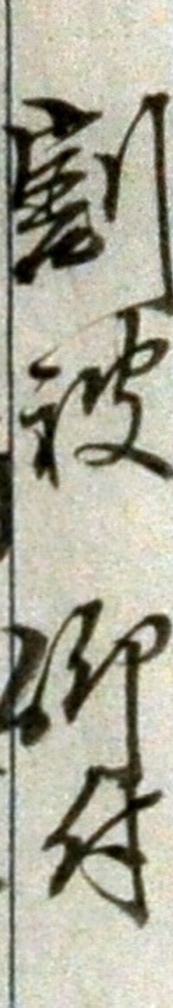割被仰付
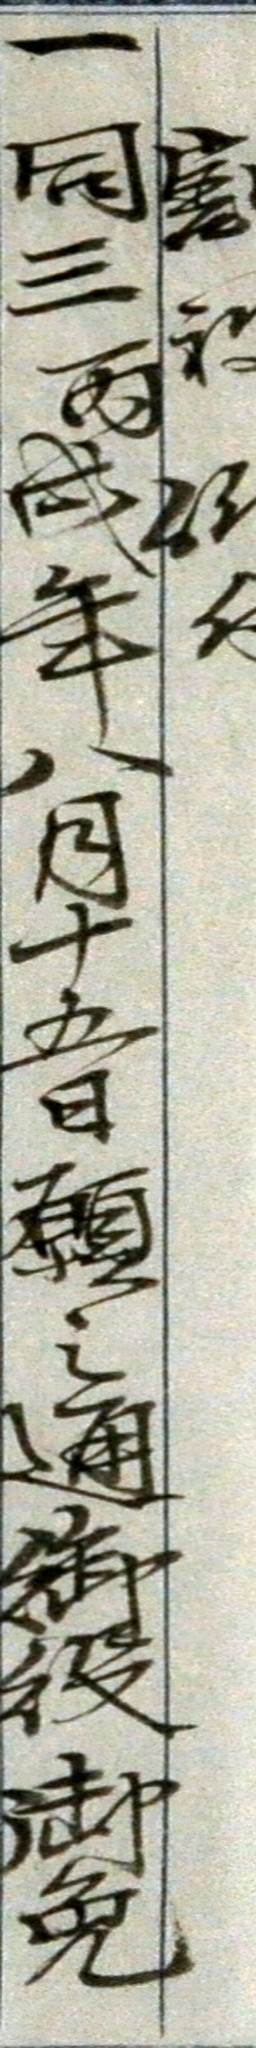一同三丙戌年八月十五日願之通御役御免
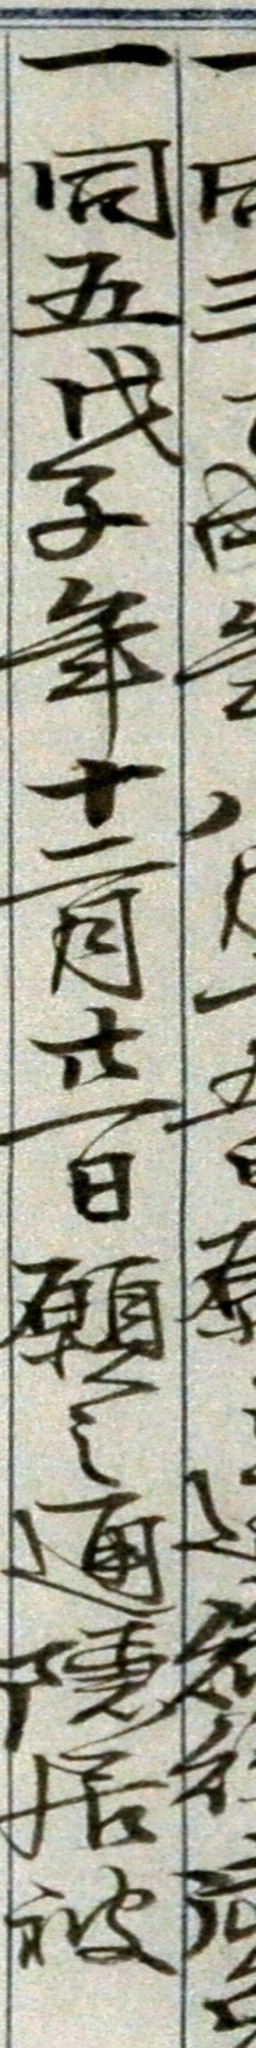一同五戊子年十二月廿一日願之通隠居被
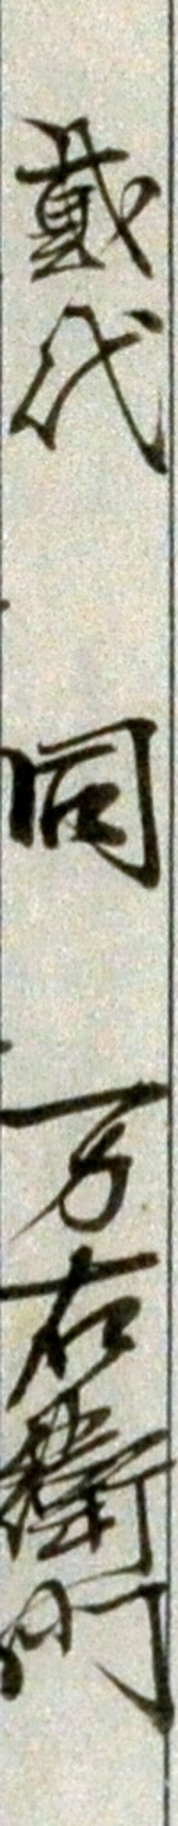戴代同万右衛門
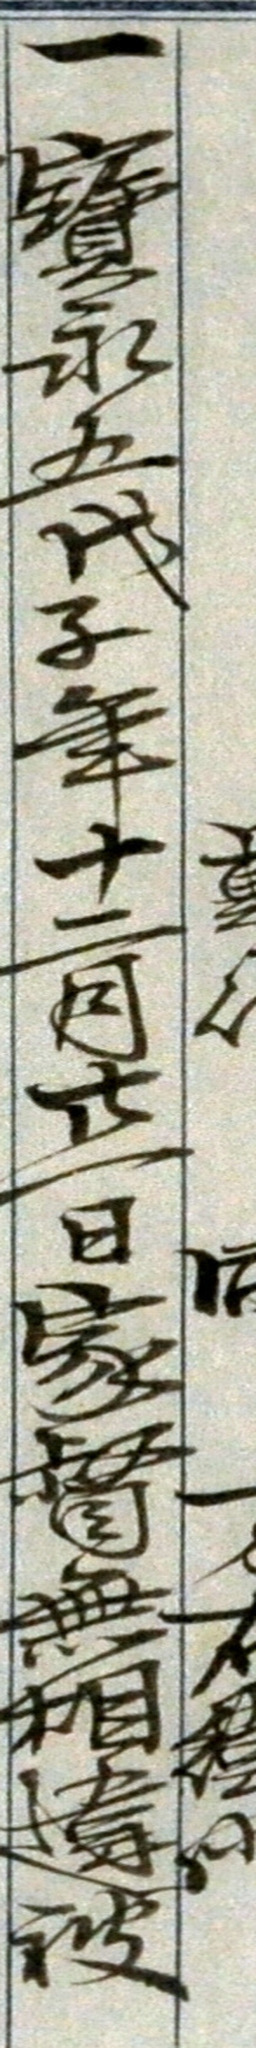一宝永五戊子年十二月廿一日家督無相違被
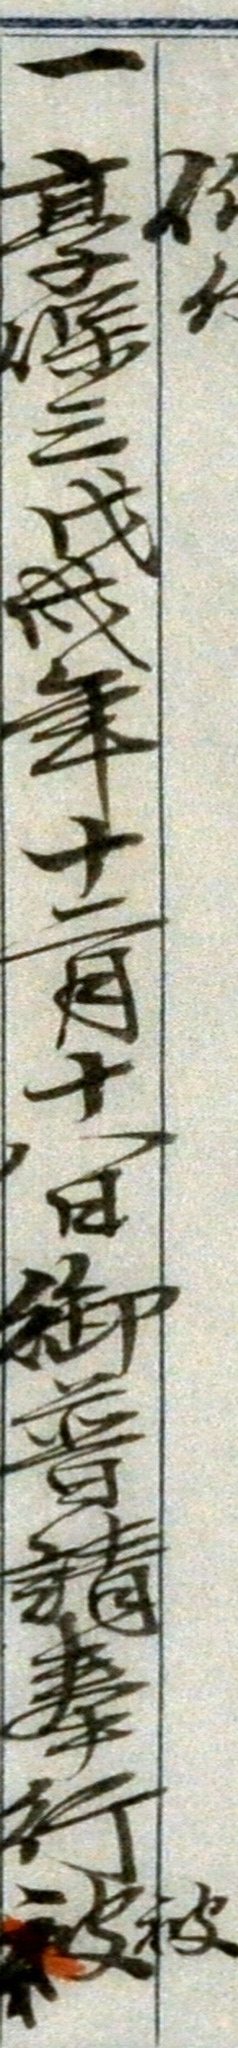一享保三戊戌年十二月十八日御普請奉行被
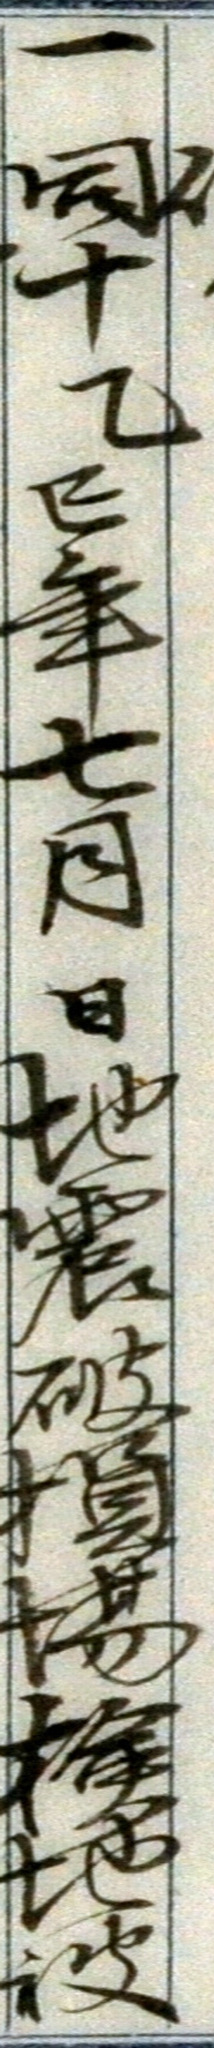一同十乙巳年七月日地震破損場検地被
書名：三好氏先代以来勤仕録、池田丈介一家勤仕録
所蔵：伊那市立高遠町図書館・合同会社AMANE
